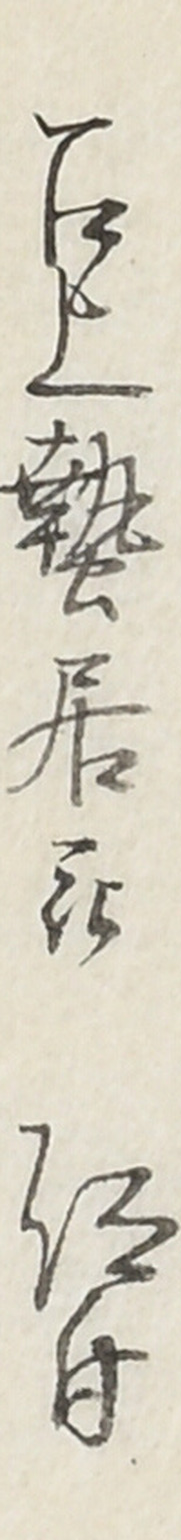召上蟄居被仰付
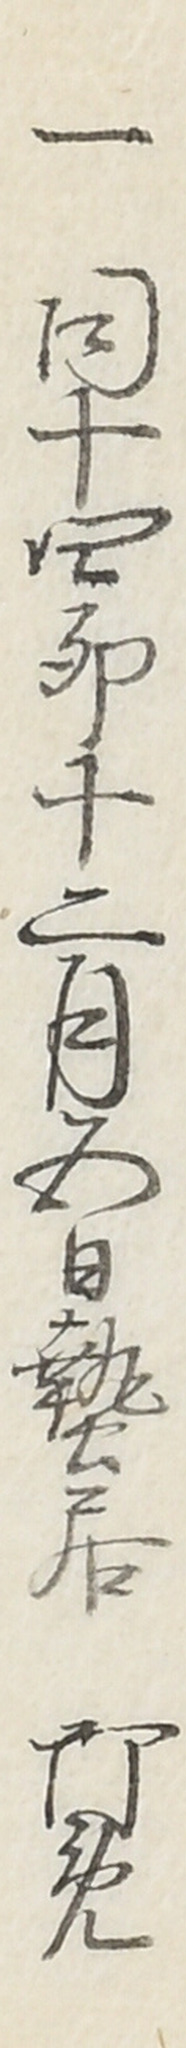一同十四卯十二月五日蟄居御免

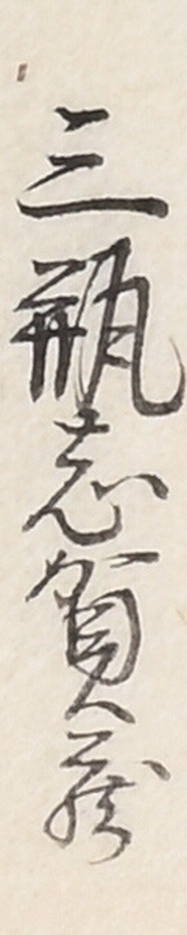三瓶志賀蔵
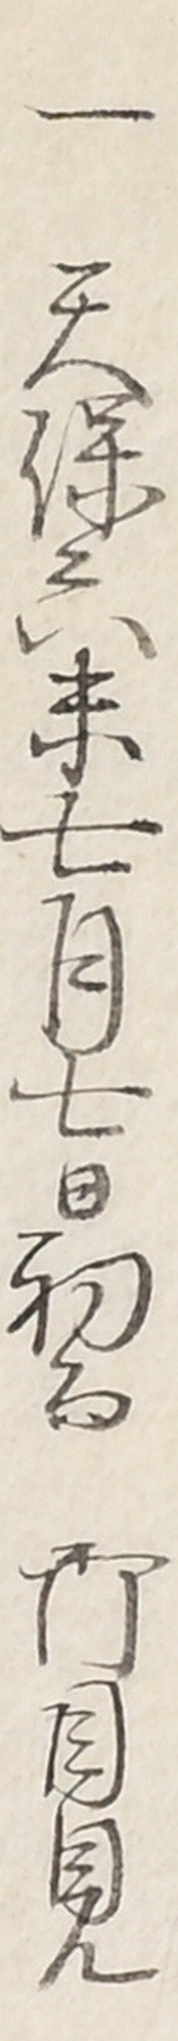一天保六未七月七日初而御目見
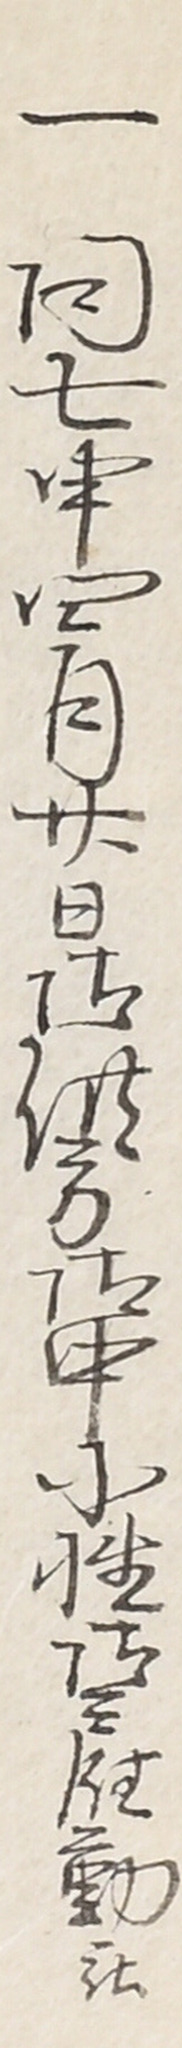一同七申四月廿日御供方御中小姓御雇勤被
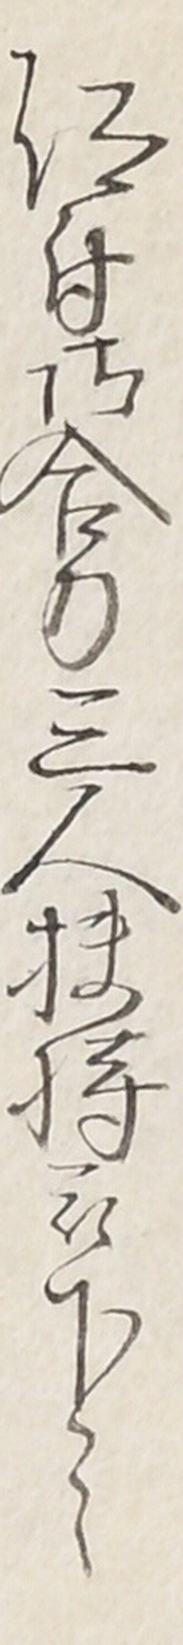仰付御合力三人扶持被下之
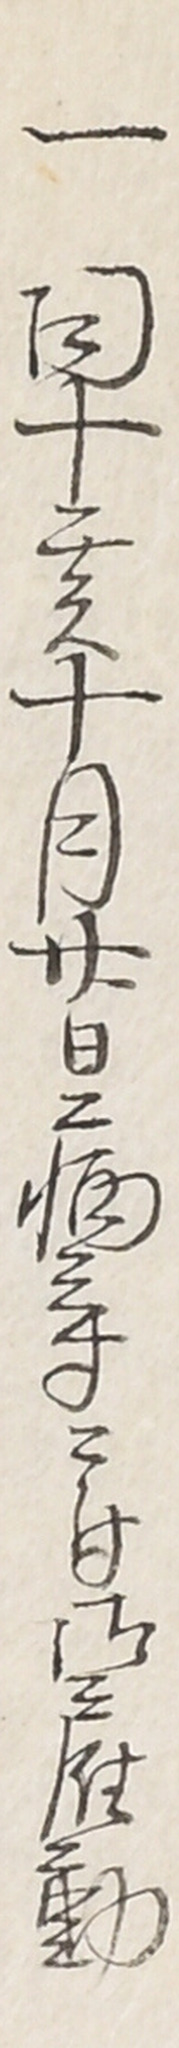一同十亥十月廿日病気ニ付御雇勤
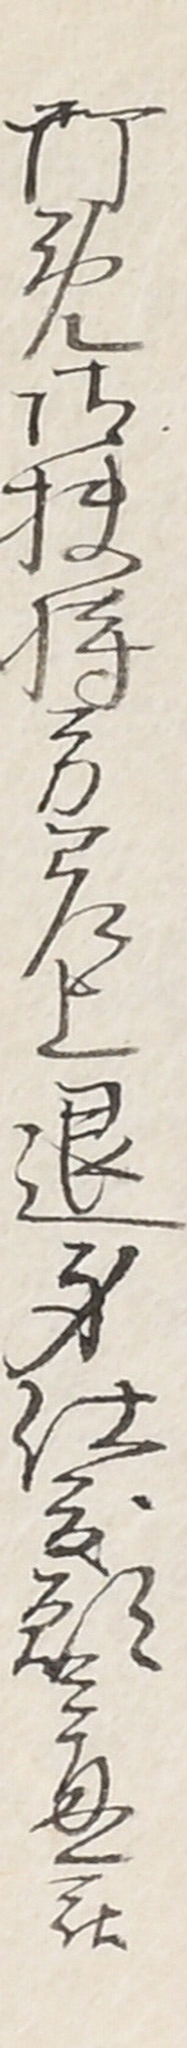御免御扶持方差上退身仕度願之通被
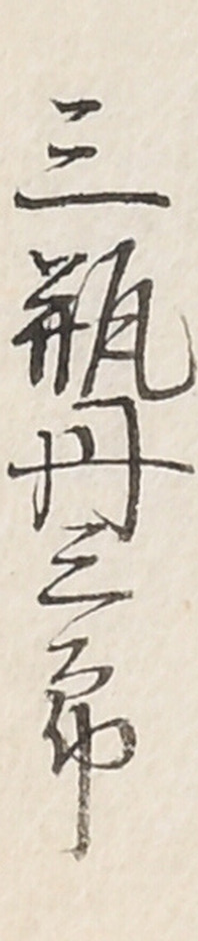三瓶丹三郎
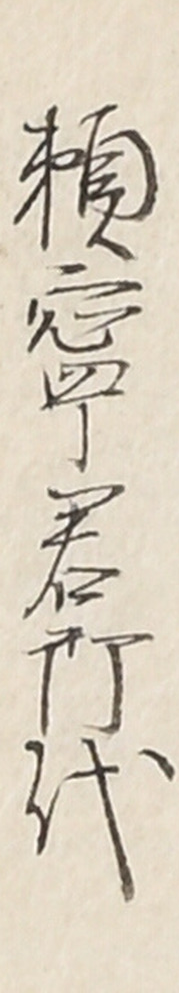頼寧君御代
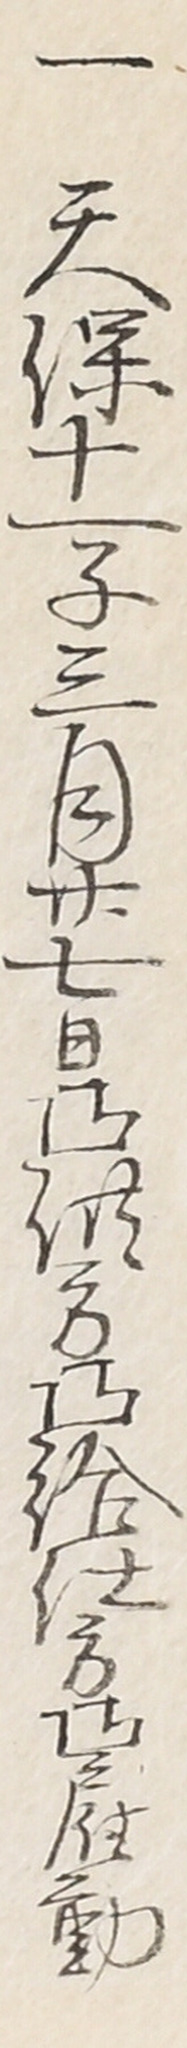一天保十一子三月廿七日御供方御給仕方御雇
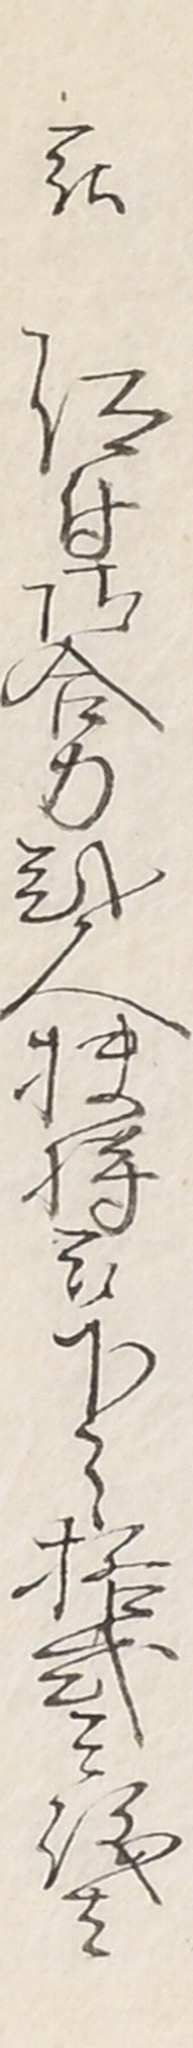被仰付御合力弐人扶持被下之格式之儀は
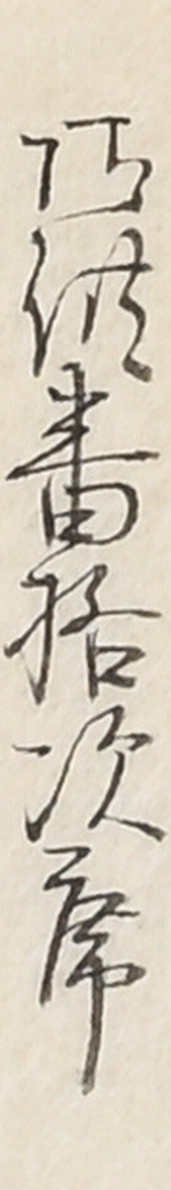御供番格次席
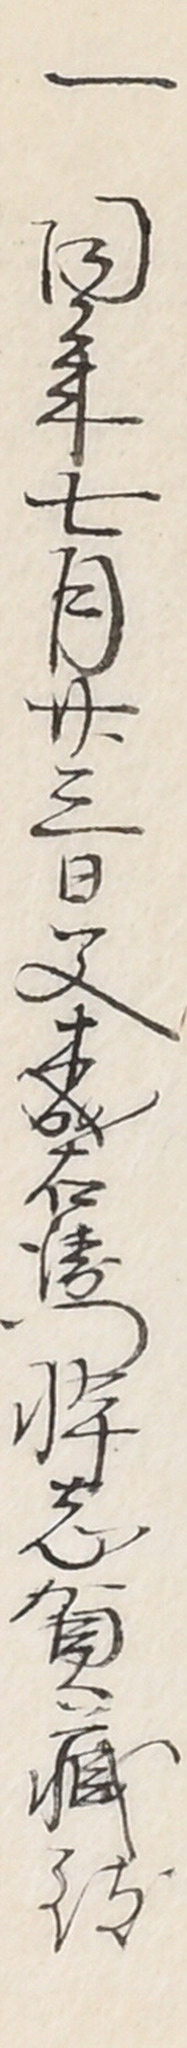一同年七月廿三日父森右衛門忰志賀蔵致
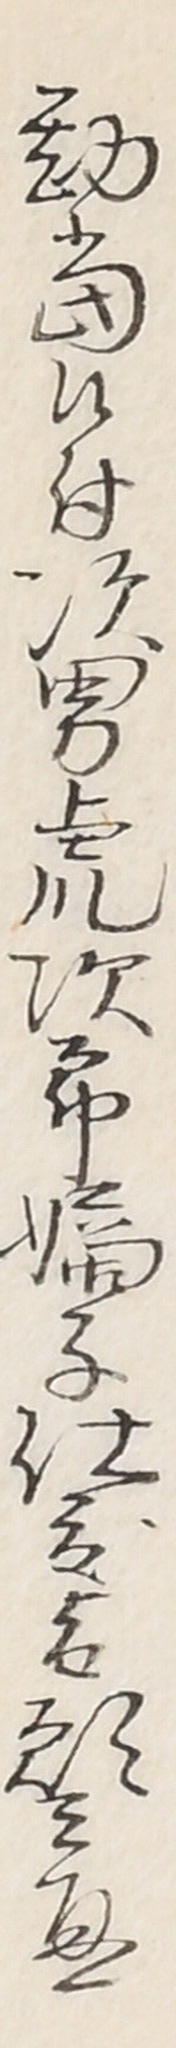勤当候付次男虎次郎嫡子仕度旨願之通
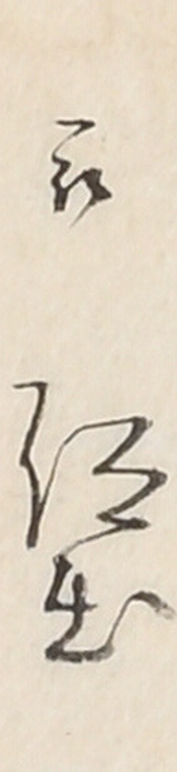被仰出
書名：給人諸士勤仕録（七）
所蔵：伊那市立高遠町図書館・合同会社AMANE
